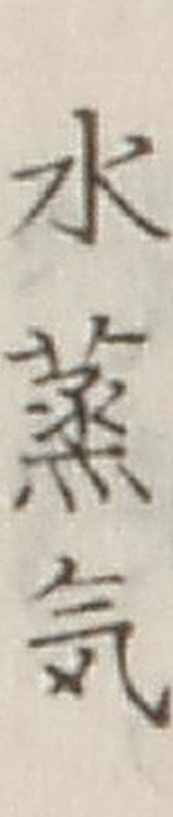水蒸気
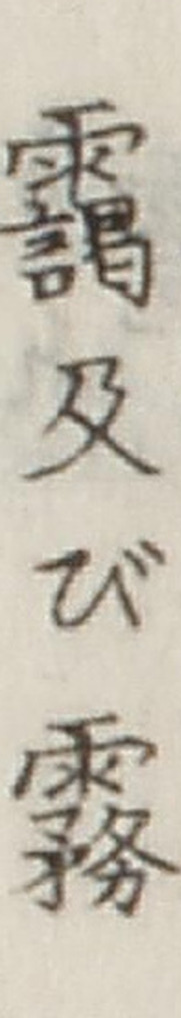靄及び霧
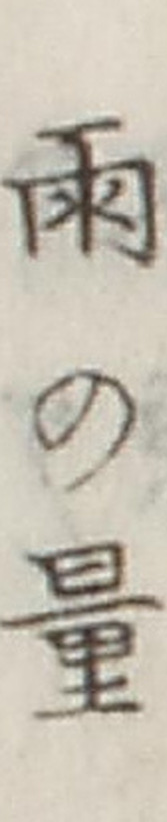雨の量
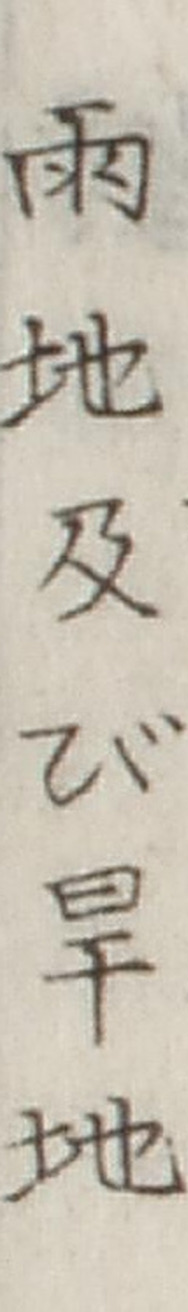雨地及び旱地

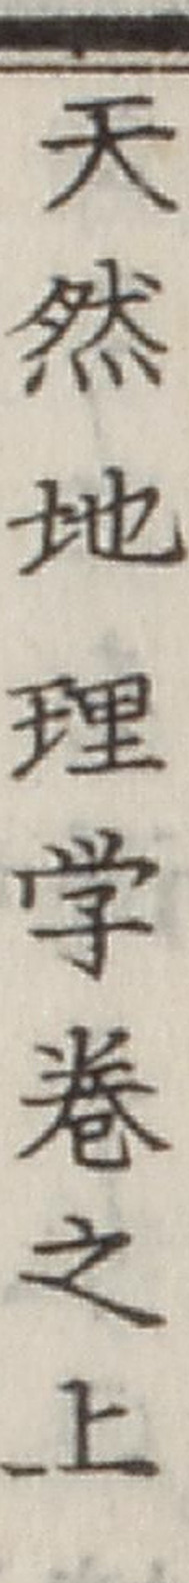天然地理学巻之上
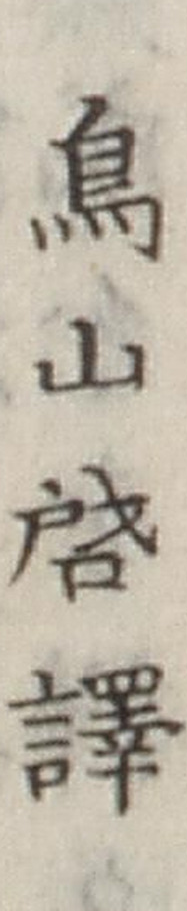鳥山啓訳
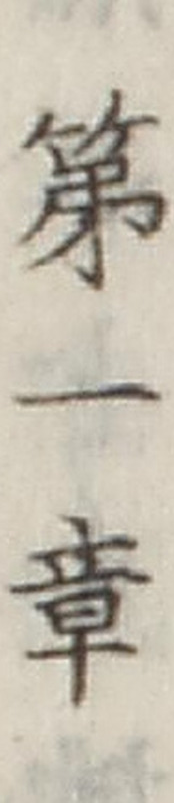第一章
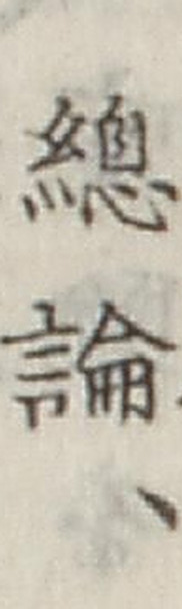総論、
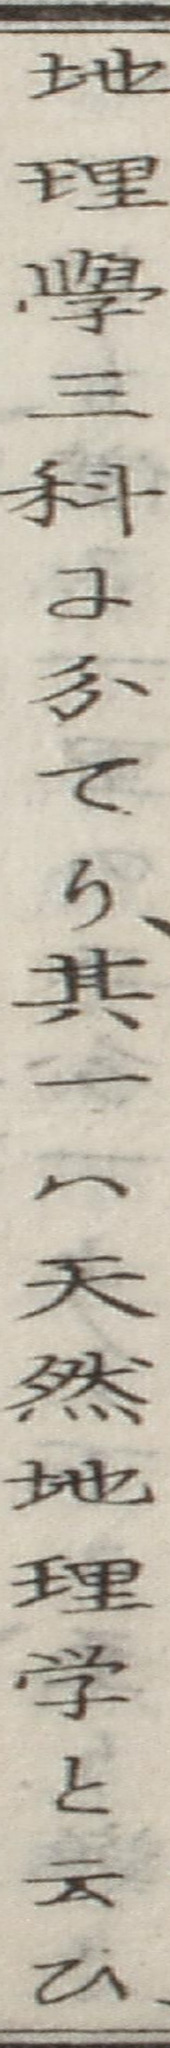地理学三科に分てり、其一は天然地理学と云ひ、
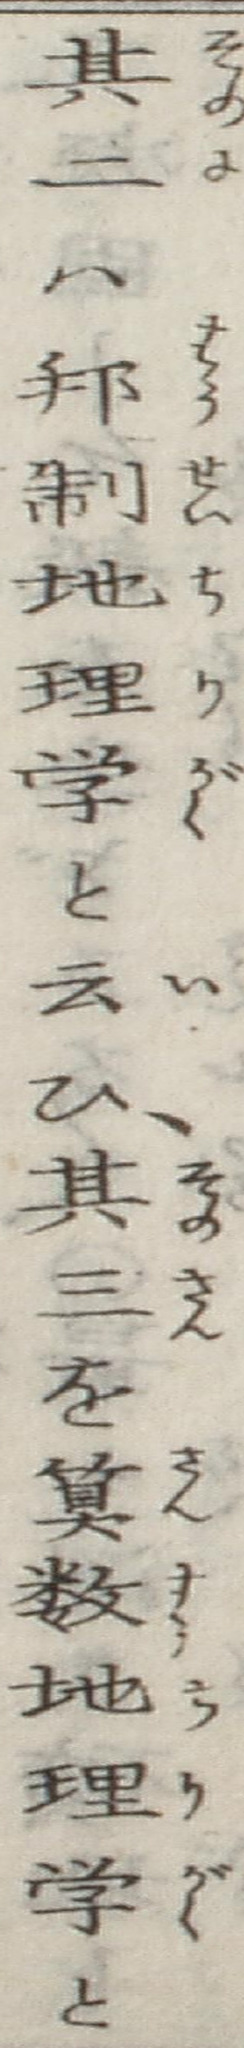其二は邦制地理学と云ひ、其三を算数地理学と
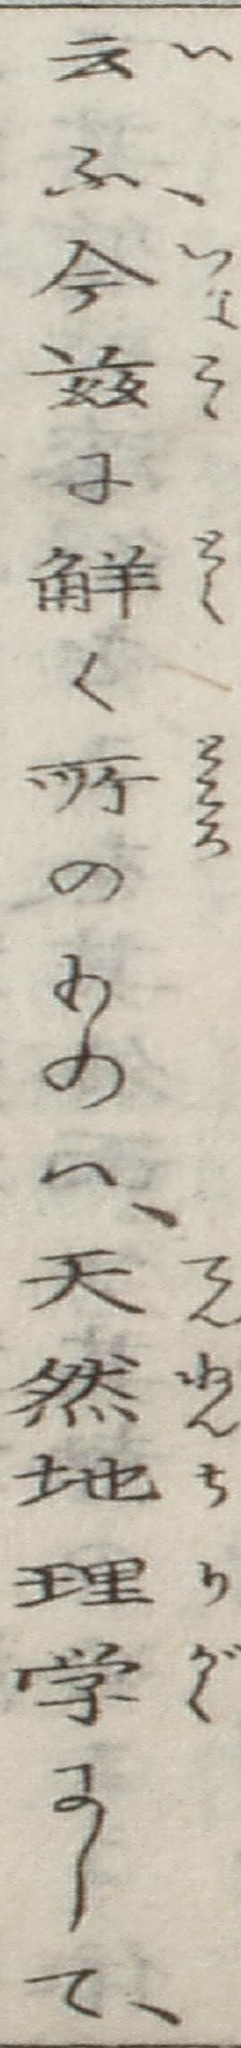云ふ、今茲に解く所のものは、天然地理学にして、
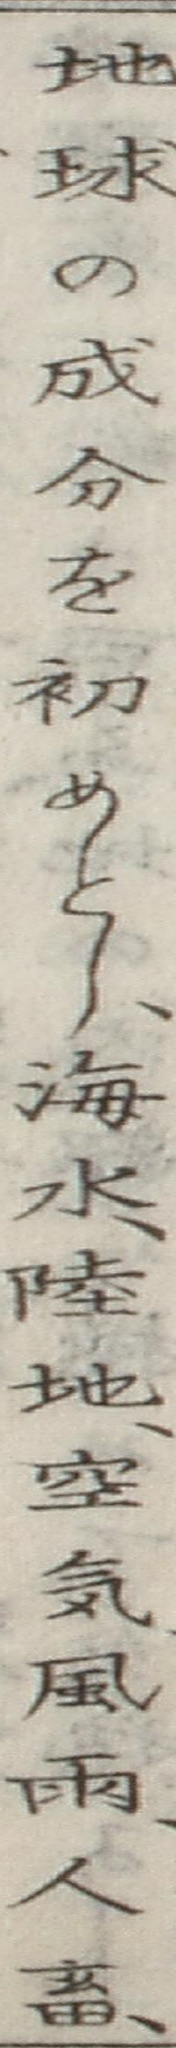地球の成分を初めとし、海水、陸地、空気、風雨、人畜、
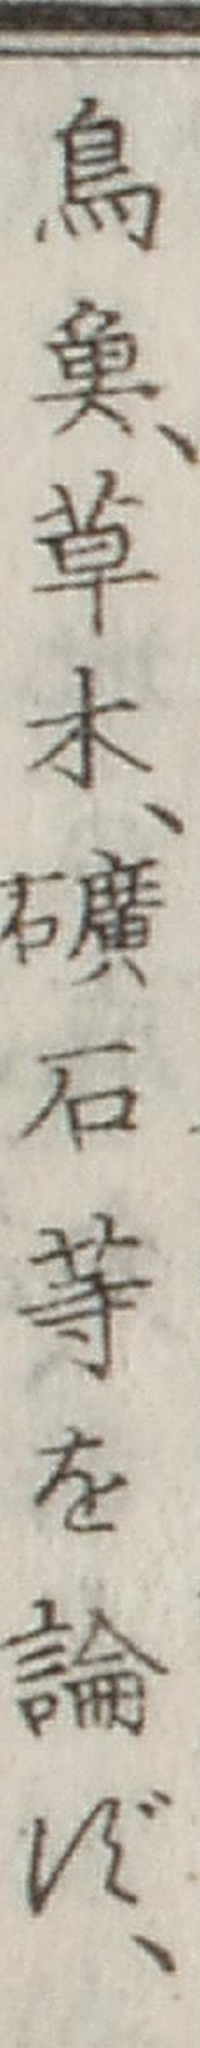鳥魚、草木、鉱石等を論ず、

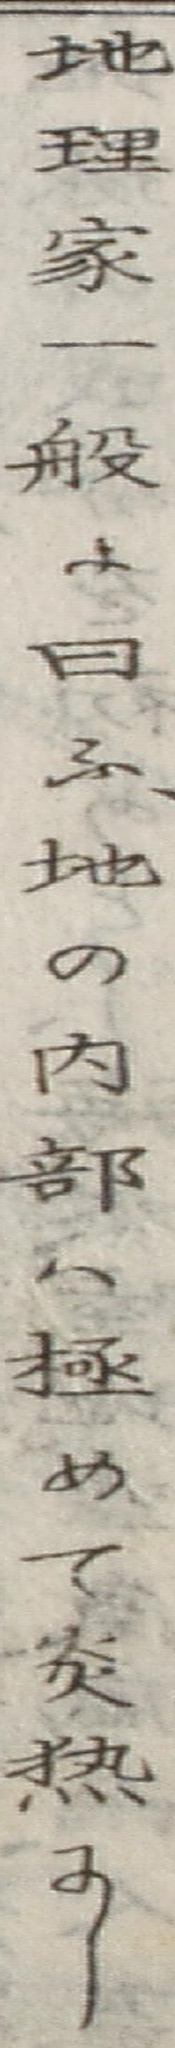地理家一般に曰ふ、地の内部は極めて炎熱にし
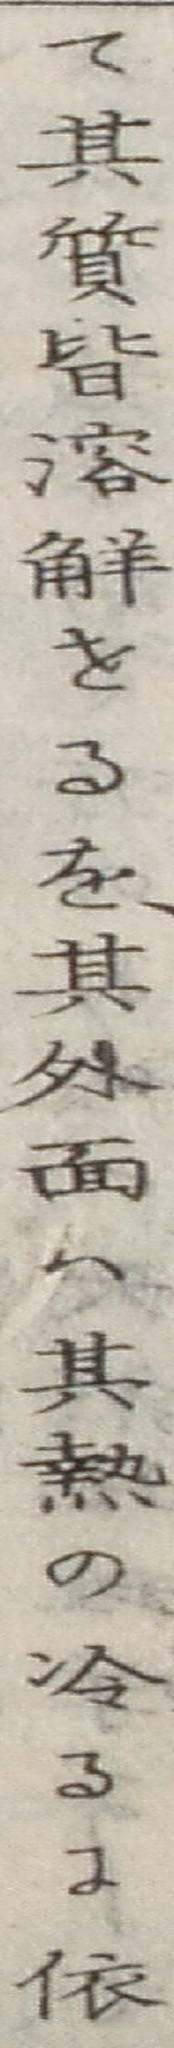て、其質皆溶解せるを、其外面は其熱の冷るに依
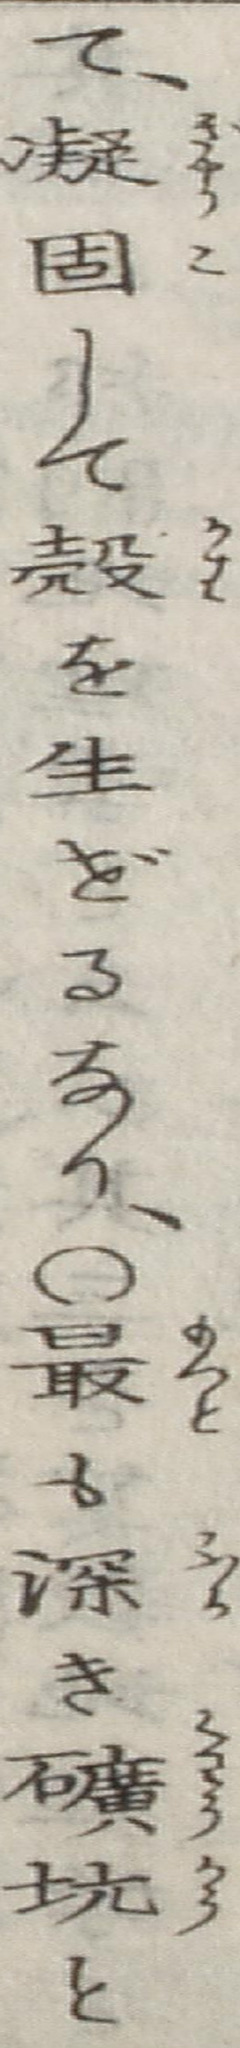て、凝固して殻を生ぜるなり、〇最も深き鉱坑と
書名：訓蒙　天然地理學　上
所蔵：東京大学地震研究所図書室 Earthquake Research Institute Library, The University of Tokyo, JAPAN
